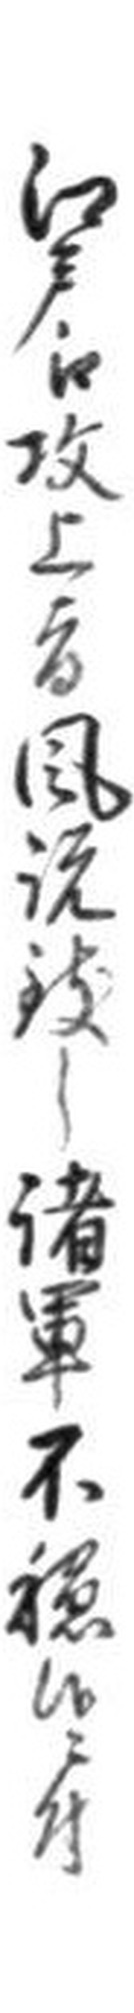江戸江攻上旨風説致し諸軍不穏候ニ付
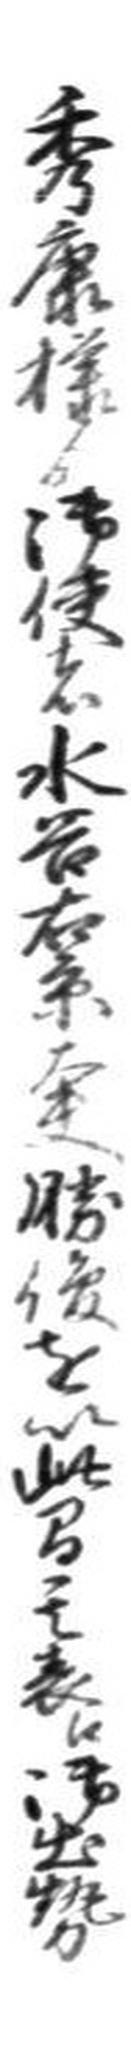秀康様ゟ御使者水谷右京大夫勝俊を以此間其表江御出勢
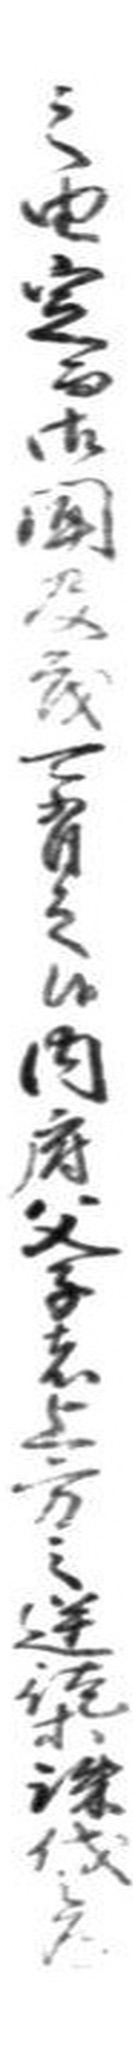之由定而御聞及も可有之候内府父子者上方之逆徒等誅伐之為
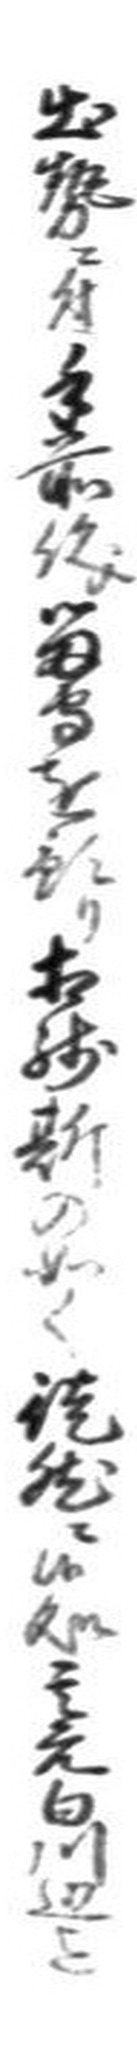出勢ニ付手前儀留守を預リ相残斯の如く徒然ニ候処其元白川辺迄
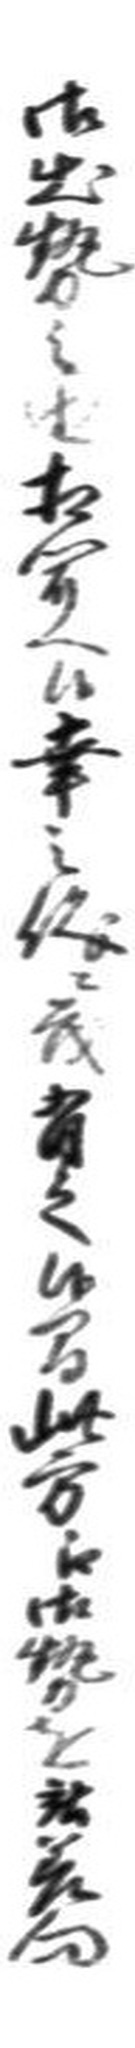御出勢之由相聞へ候幸之儀ニも有之候間此方江御勢を被差向
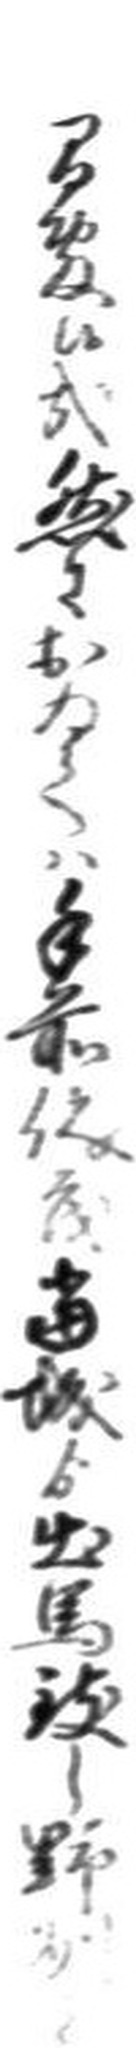間敷候哉然におゐてハ手前儀も当城ゟ出馬致し野州
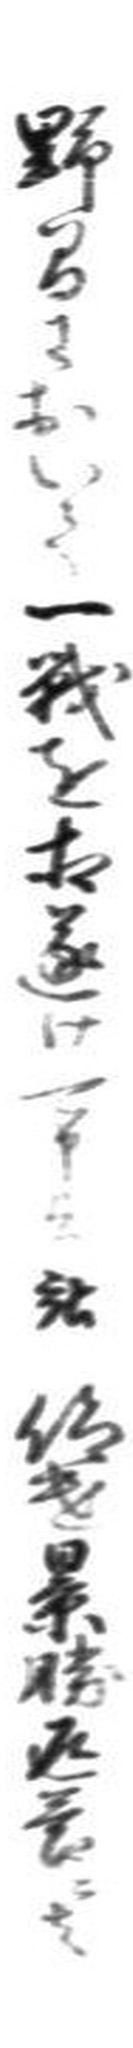野間において一戦を相遂け可申旨被仰遣景勝返答ニ者
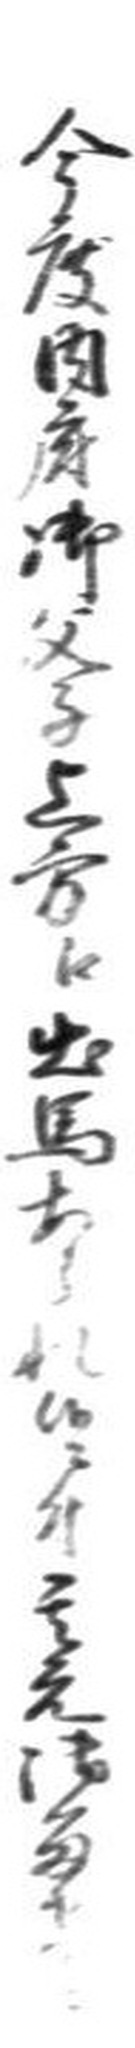今度内府御父子上方江出馬あられ候ニ付其元御留守
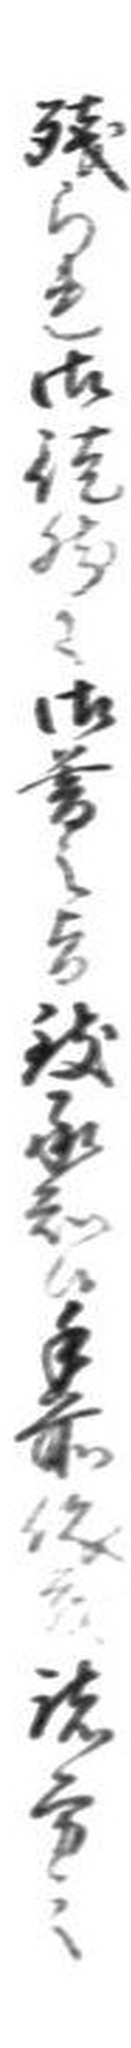残られ御徒然に御暮之旨致承知候手前儀も諸方之
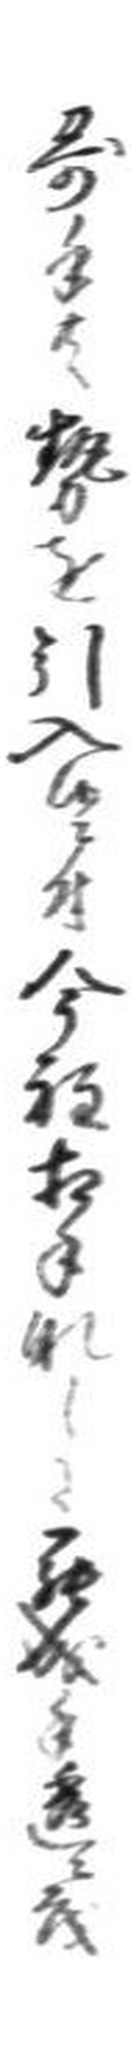寄手共勢を引入候ニ付今程相手なしに罷成手透ニも
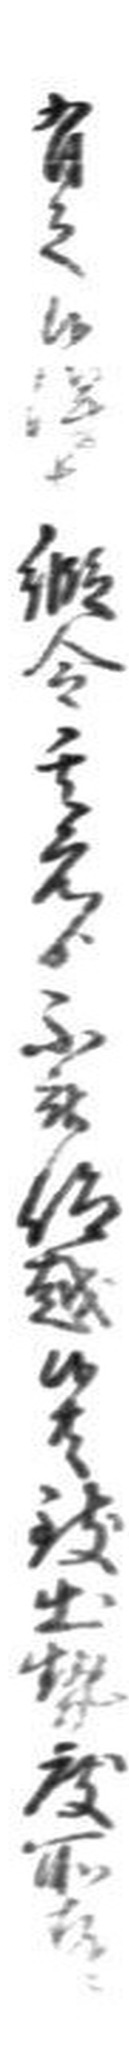有之候得者縦令其元ゟ不被仰越候共致出勢度所趣ニ
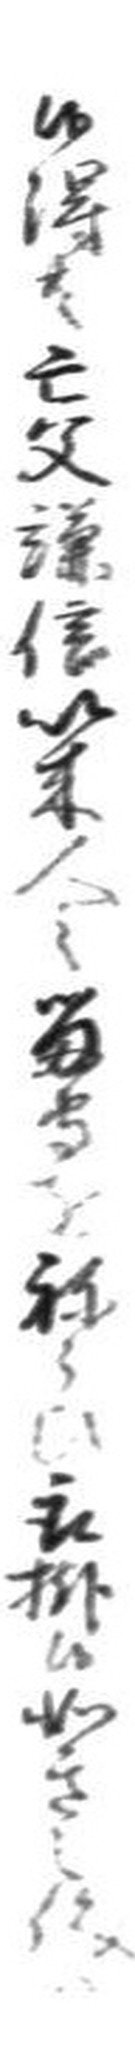候得共亡父謙信以来人之留守をねらひ取掛候如き之儀ハ
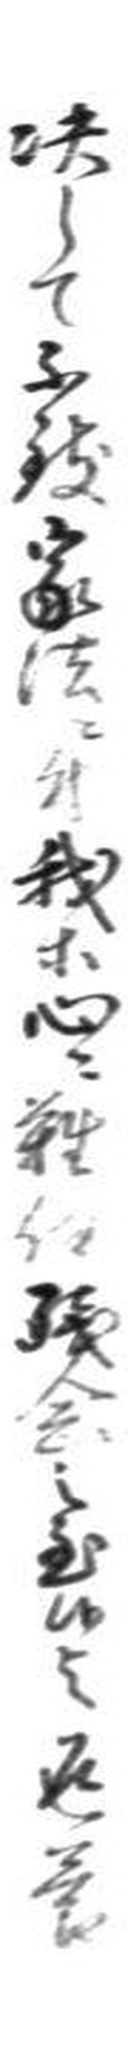決して不致家法ニ付我等心ニ難任残念之至候と返答

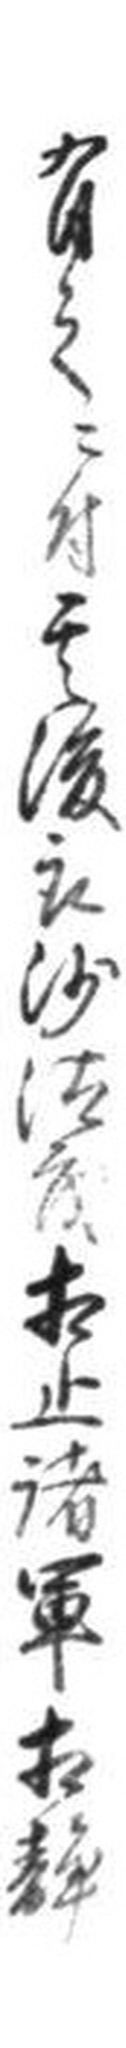有之ニ付其後取沙汰も相止諸軍相静
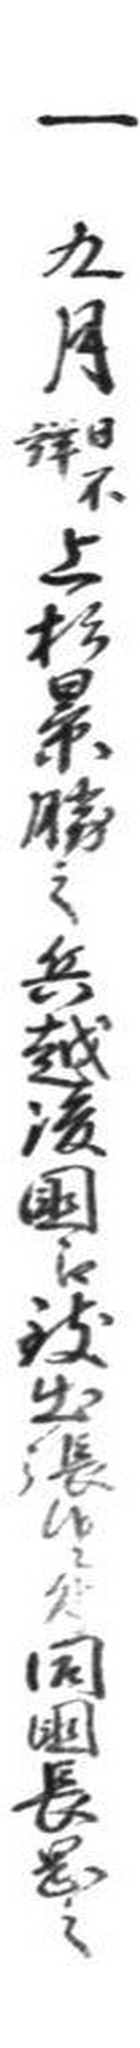一九月日不詳上杉景勝之兵越後国江致出張候ニ付同国長岡之
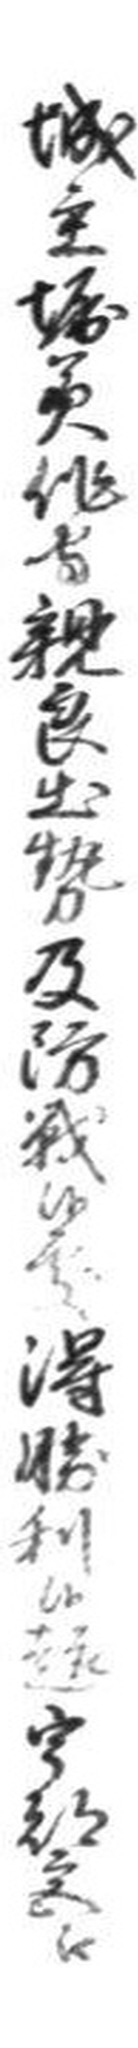城主堀美作守親良出勢及防戦候処得勝利候趣宇都宮江
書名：家譜 一 秀康公 従天正二年到慶長十二年
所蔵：福井県文書館 Fukui Prefectural Archives
